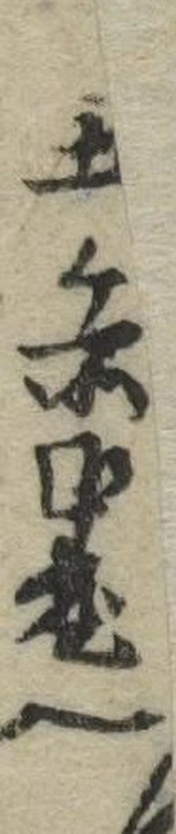五ケ所御台
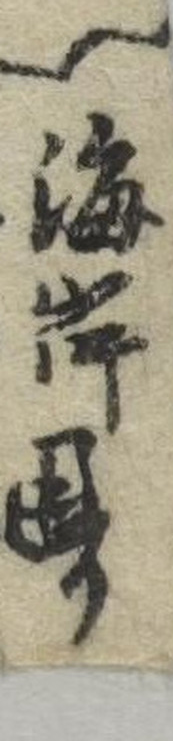海岸周り
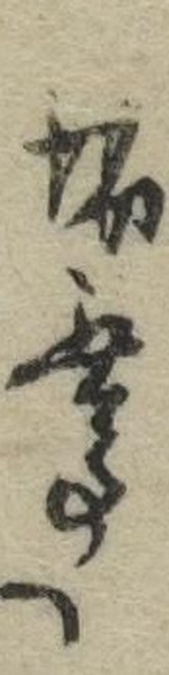場無事
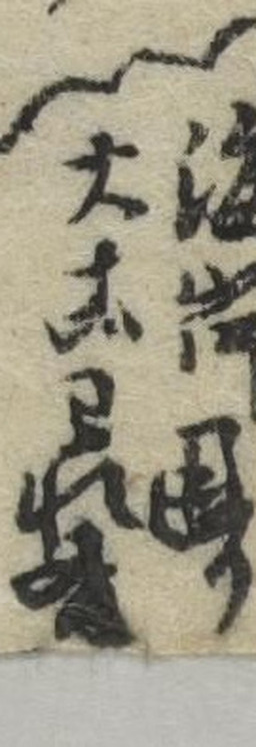大こわれ有
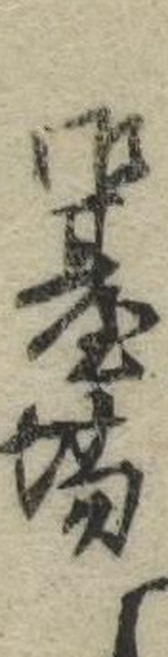御台場
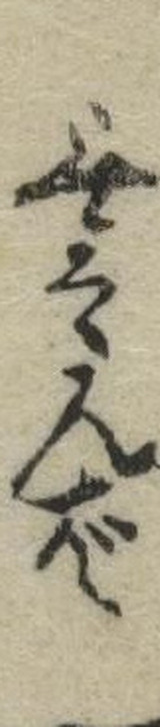無そんば
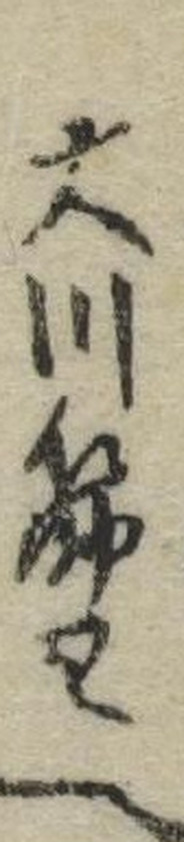大川筋わ
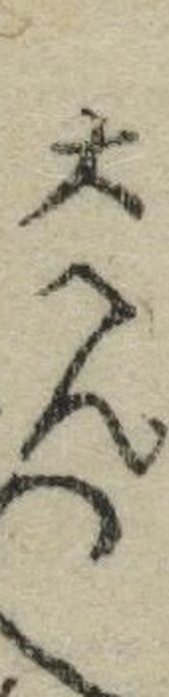大へん
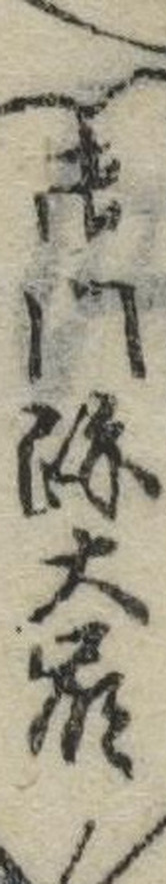御門跡大崩
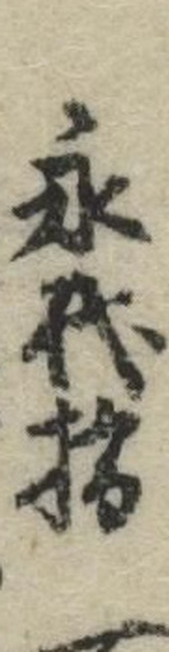永代橋
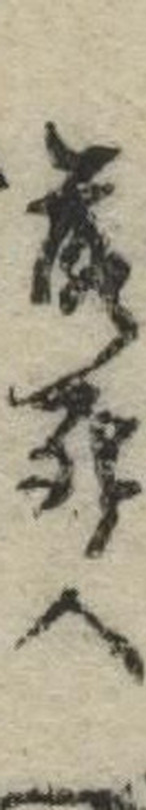落死人
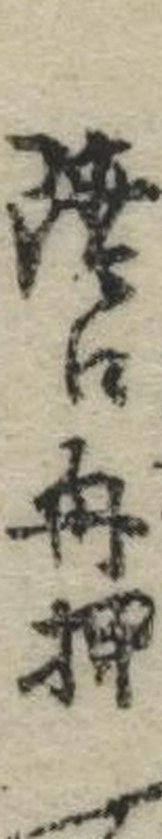陸江舟押
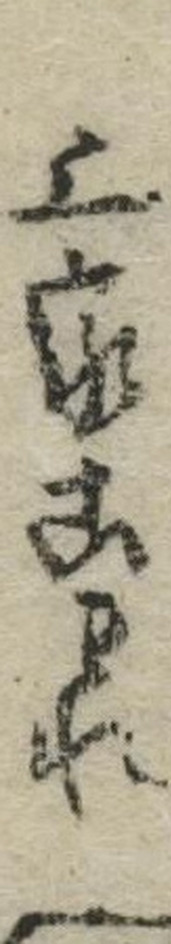上家こわれ
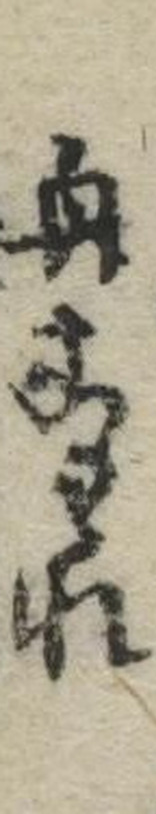舟こわれ
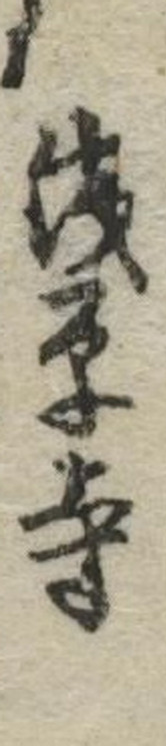浅草寺
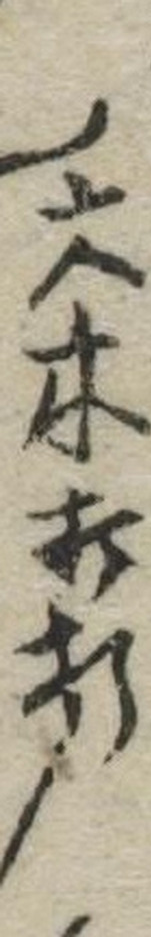大木打折
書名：安政三年辰八月廿五日夜　大江都御屋敷方寺社市中共　大嵐水入場所明細書之寫　并街道筋近郷聞書
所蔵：東京大学地震研究所図書室 Earthquake Research Institute Library, The University of Tokyo, JAPAN
